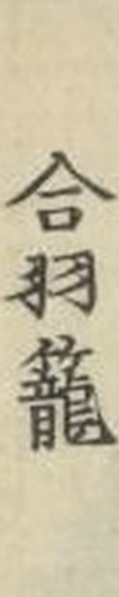合羽籠
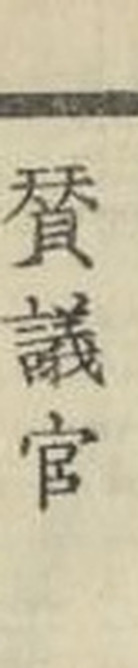賛議官
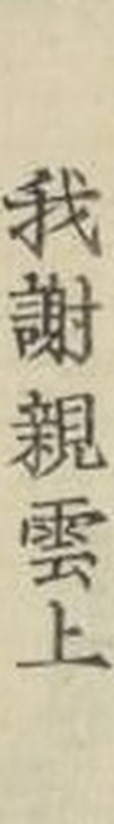我謝親雲上
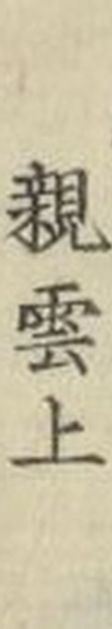親雲上

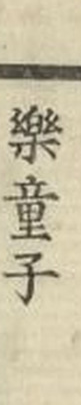楽童子
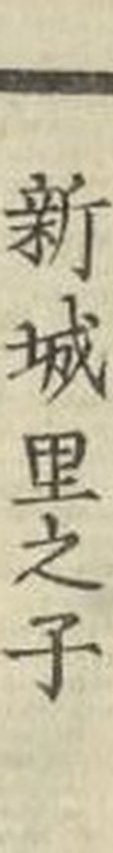新城里之子
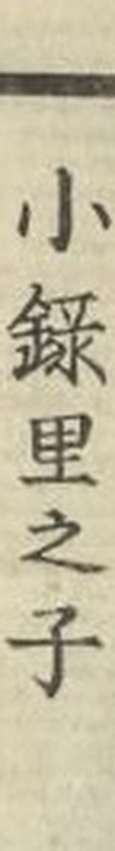小録里之子
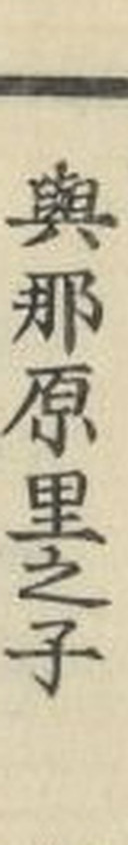与那原里之子
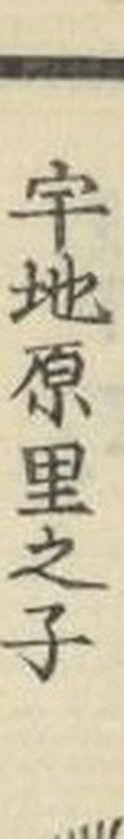宇地原里之子
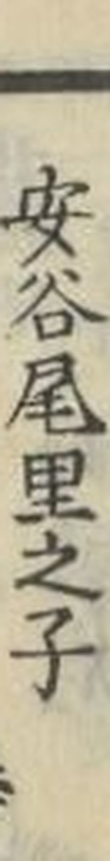安谷尾里之子
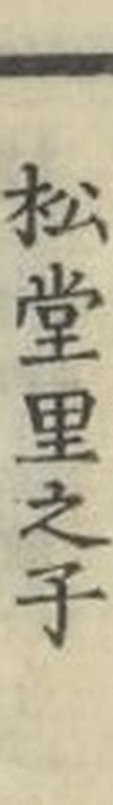松堂里之子
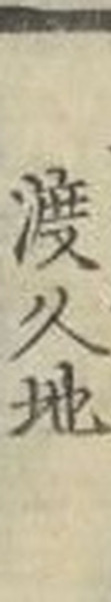渡久地
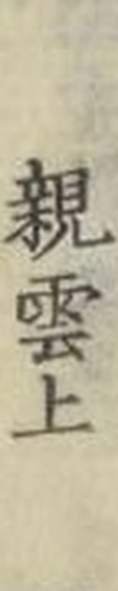親雲上

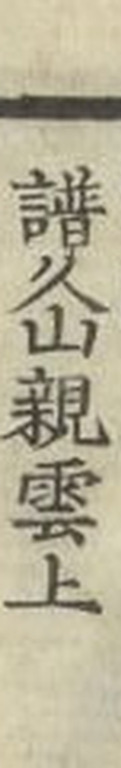譜久山親雲上
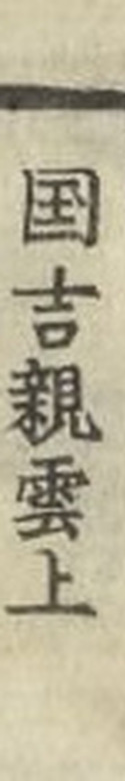国吉親雲上
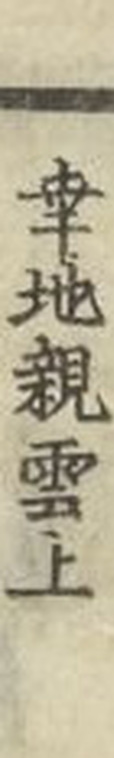幸地親雲上
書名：琉球解語
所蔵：University of the Ryukyus Library
